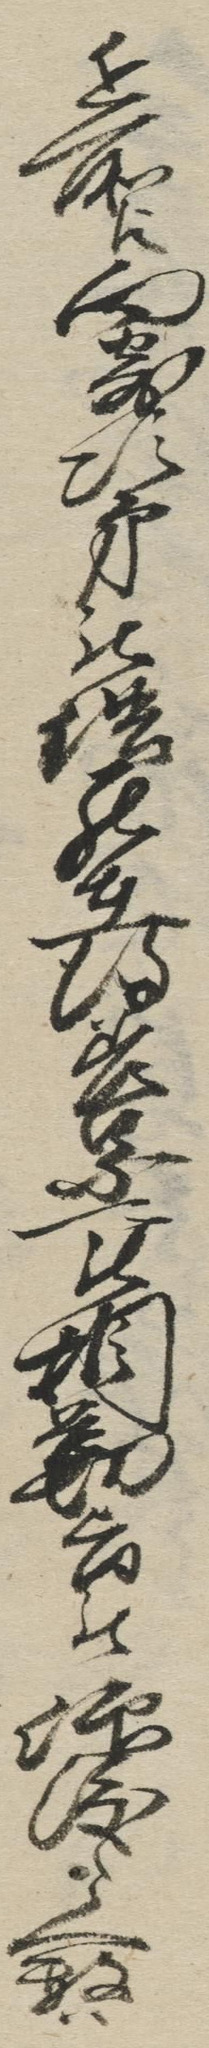近所江向寄次第被詰罷在得差図被相勤旨被仰渡候人数ハ
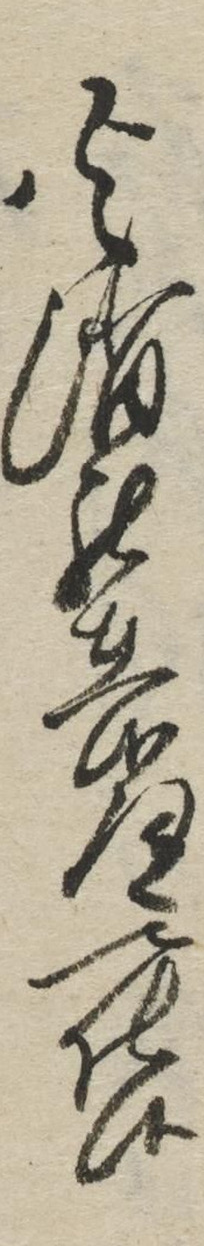火消罷在候通可仕候
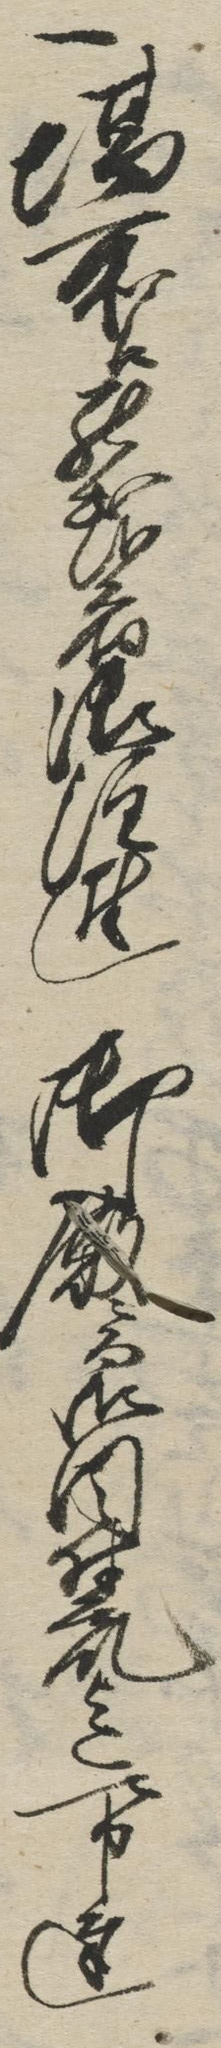一場所江罷出候者御注進御殿二而御目付衆迄可申達
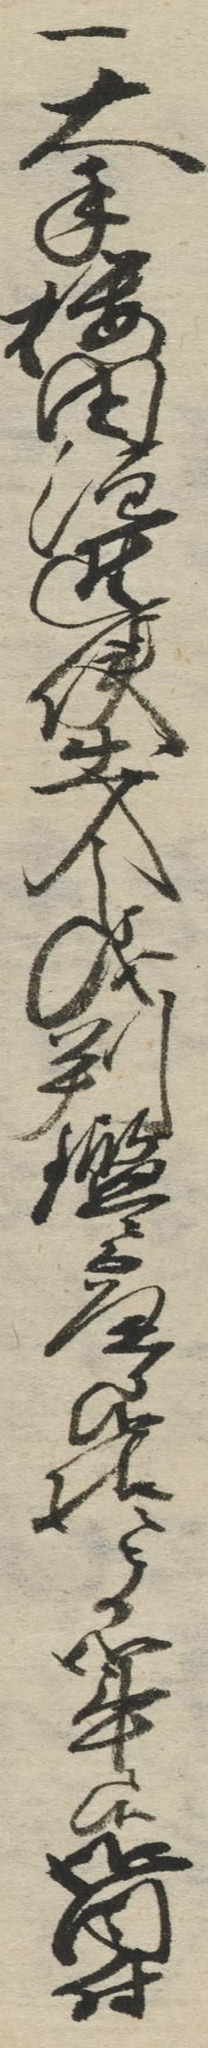一大手桜田注進使出入儀判鑑二而通候様二との御事二候御目付
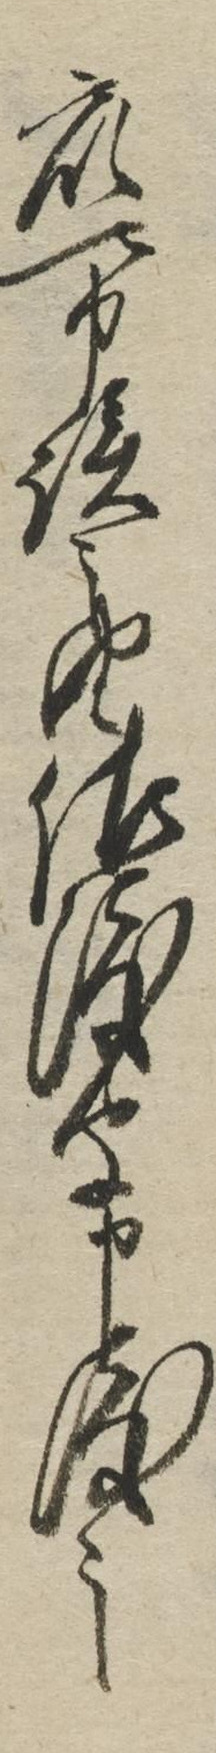衆可申渡之由佐渡守申渡之
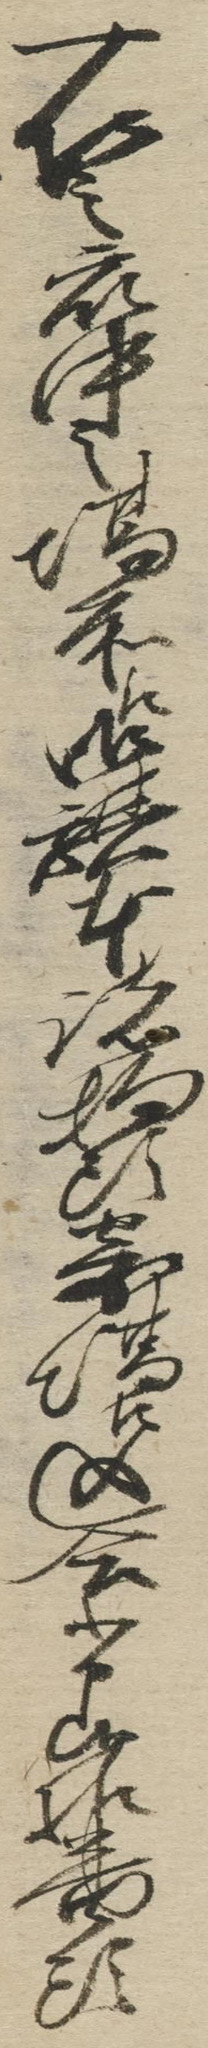一右之衆中之場所江御旗本諸物頭寄場江込合不申候様番頭

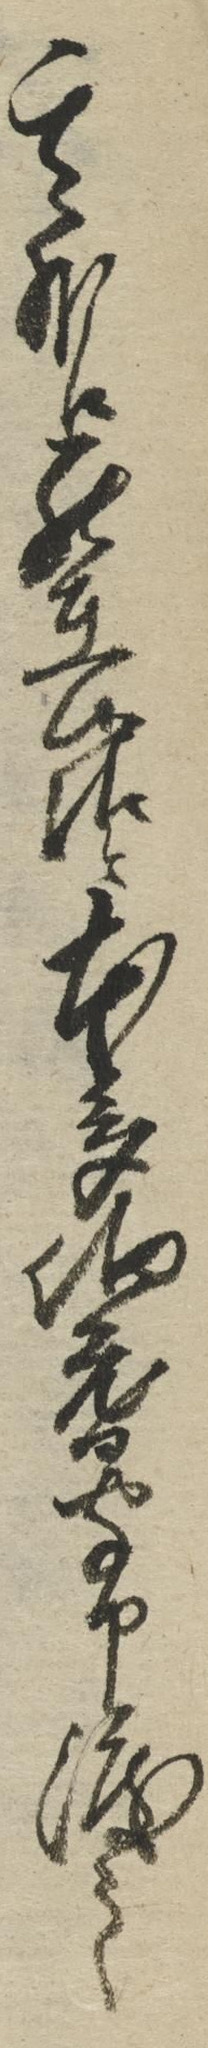其外江罷在候様と本多伯耆守申渡之
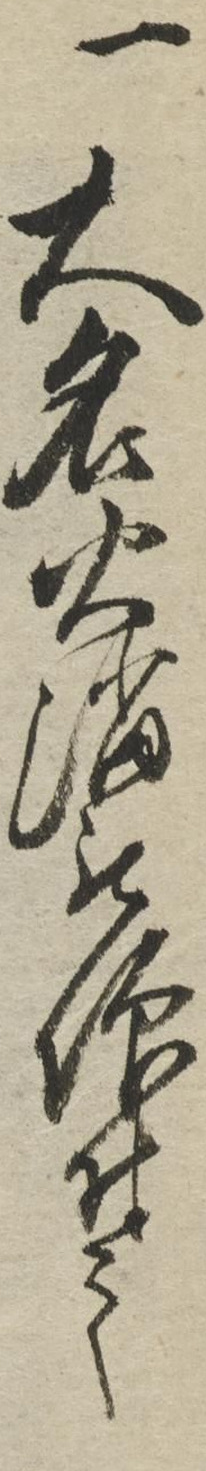一大名火消被仰付之
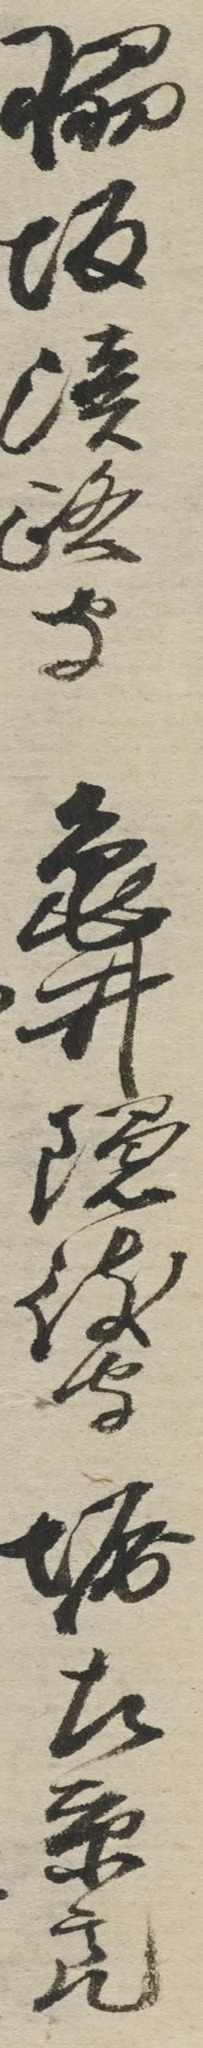脇坂淡路守亀井隠岐守堀左京亮
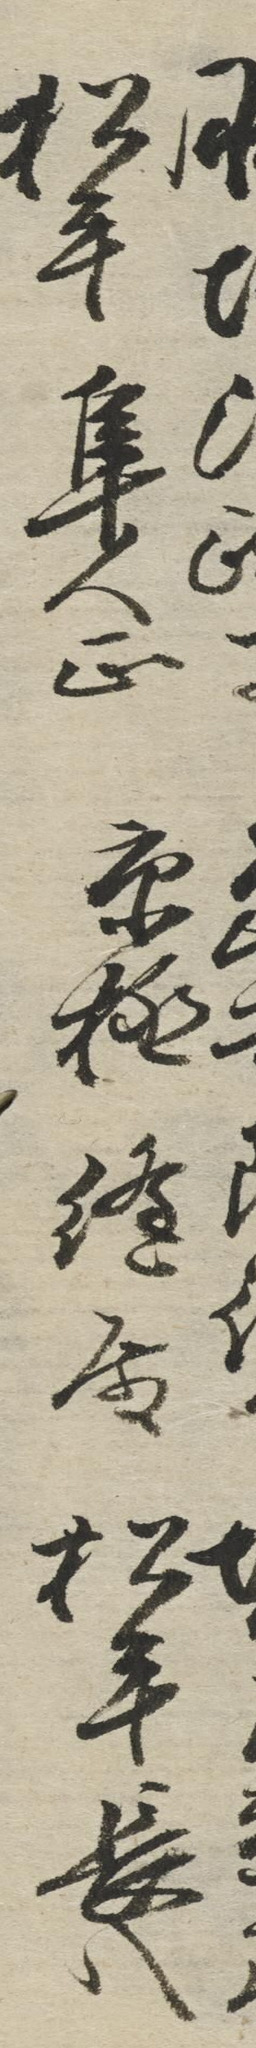松平隼人正京極修理松平長哉
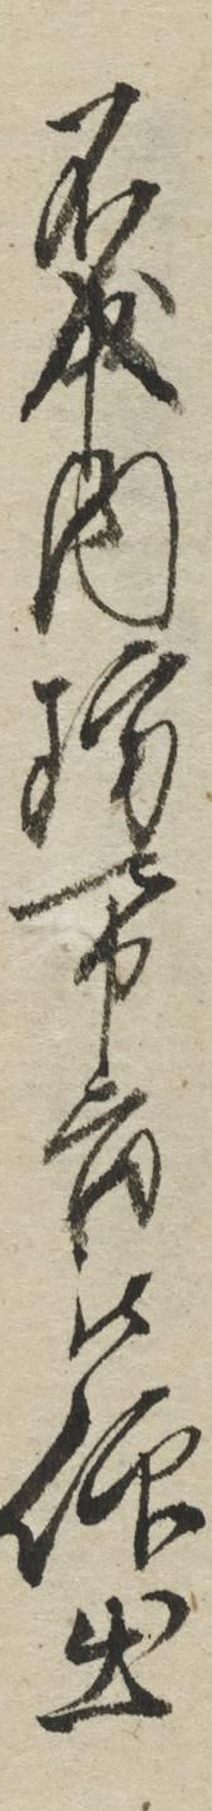不成内防可申旨被仰出
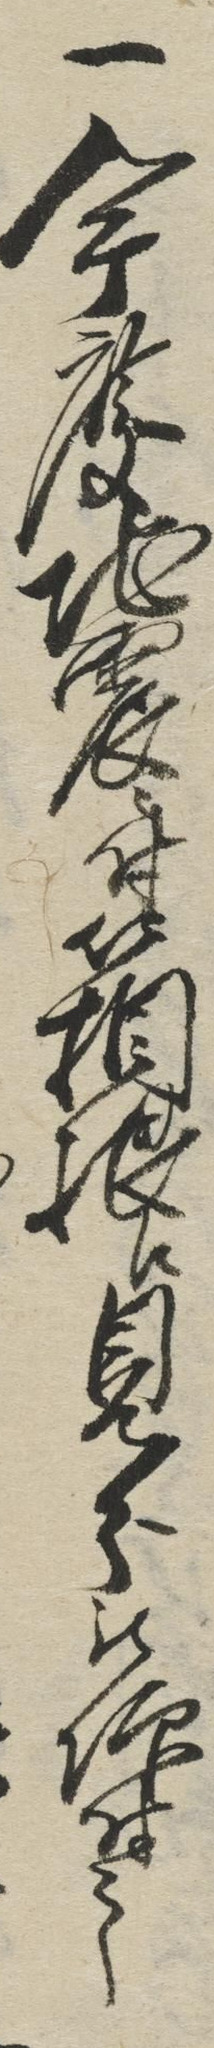一今度地震二付箱根江見分被仰之
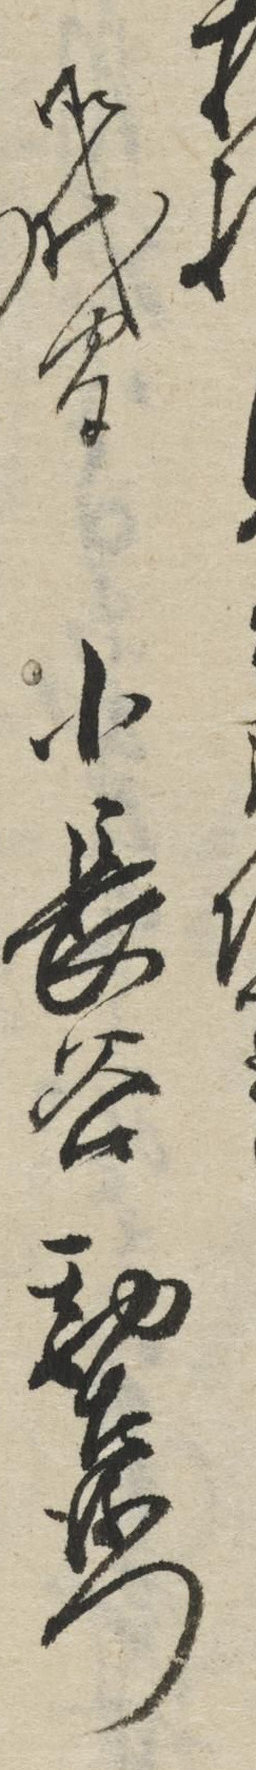御代官小長谷勘左衛門
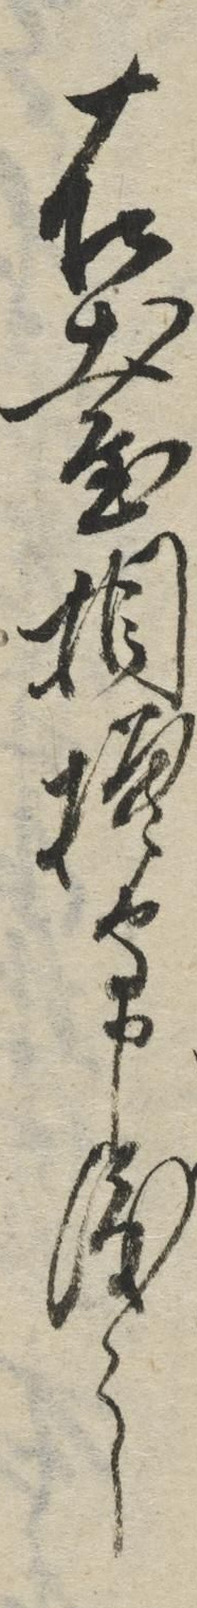右土屋相模守申渡之
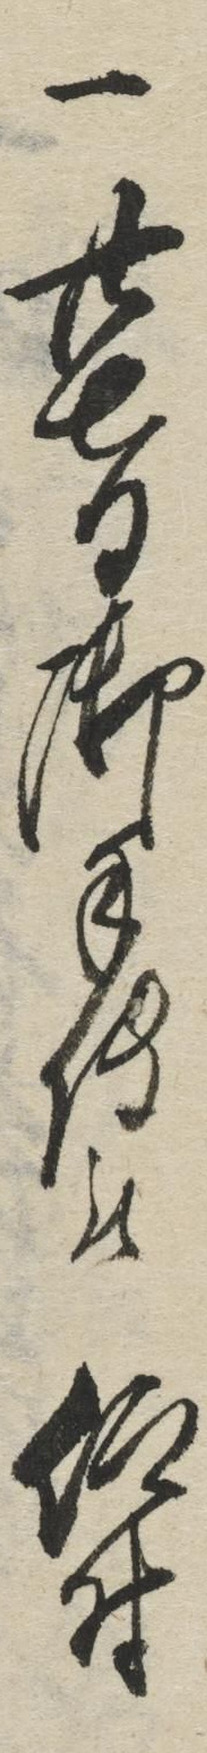一廿七日御手伝被仰付
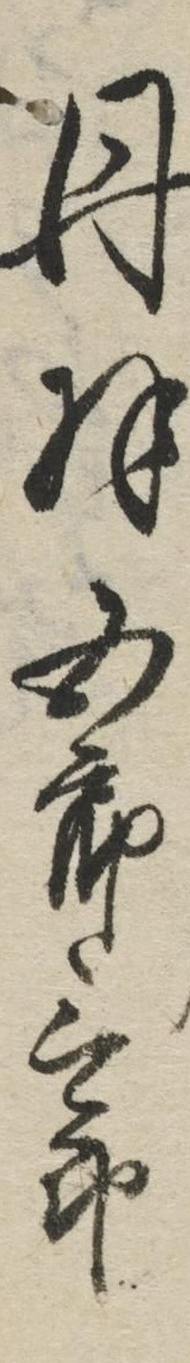丹羽五郎三郎
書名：元禄地震記
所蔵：東京大学地震研究所図書室 Earthquake Research Institute Library, The University of Tokyo, JAPAN
